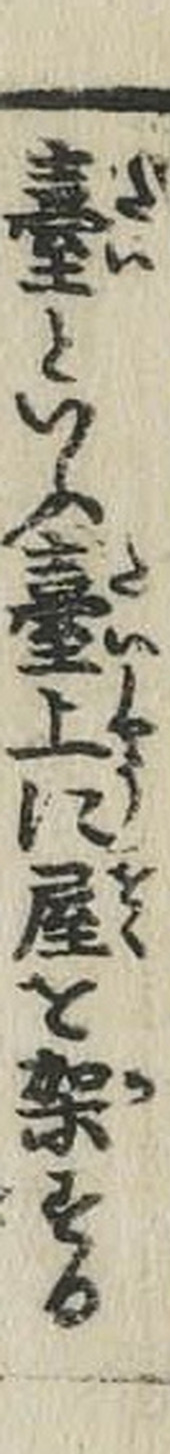台といふ台上に屋を架する
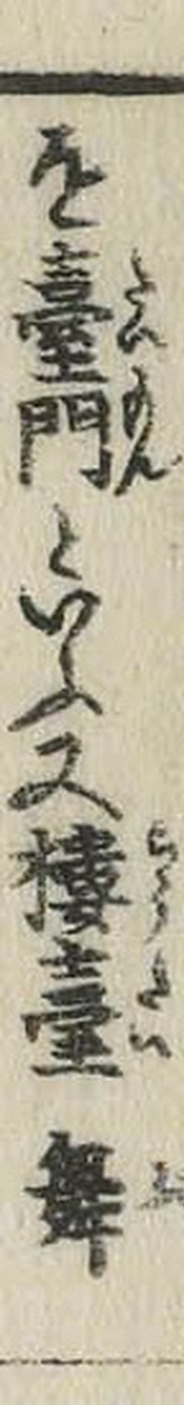を台門といふ又楼台舞
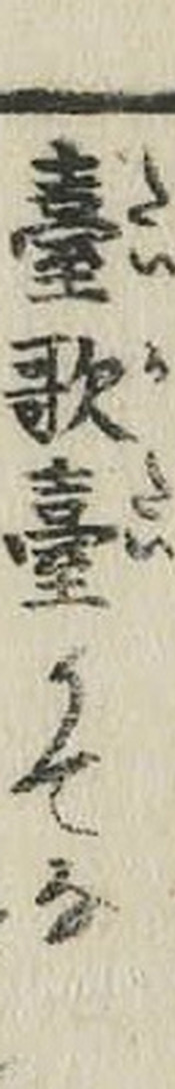台歌台うてな
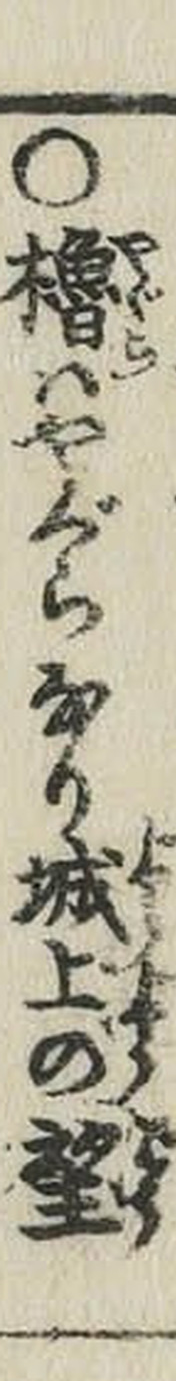○櫓はやぐらなり城上の望
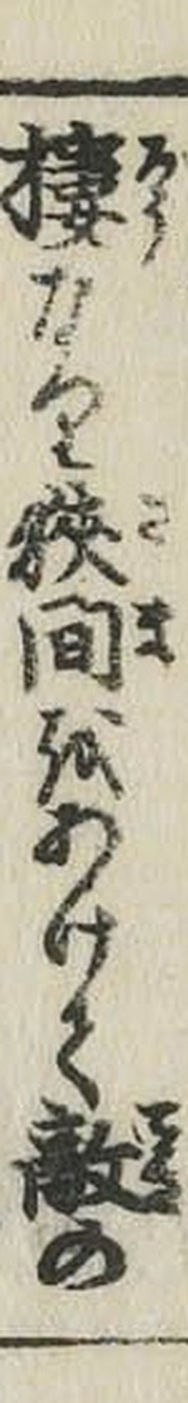楼なり狭間をあけて敵の
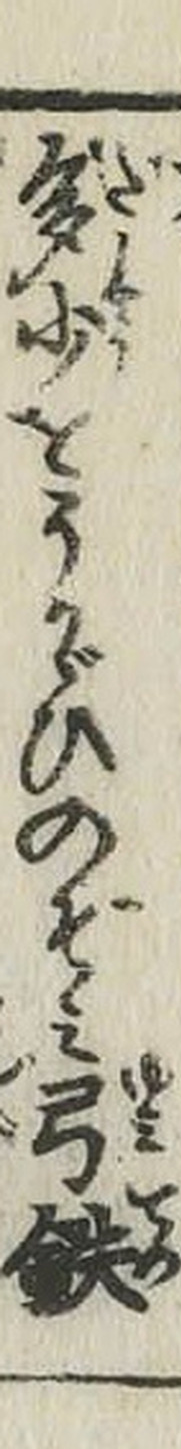多少をうかゞひのぞみ弓鉄
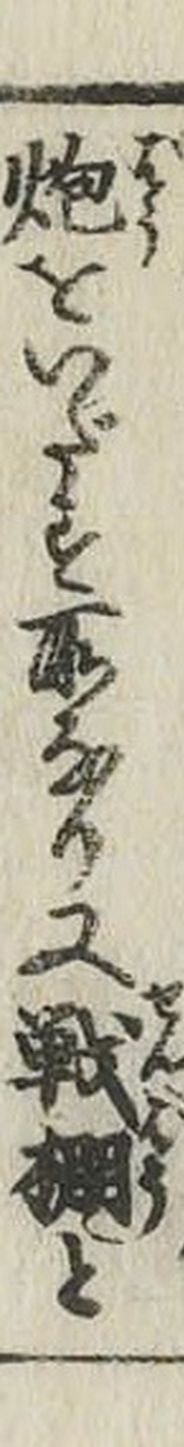炮をいだす所なり又戦棚と
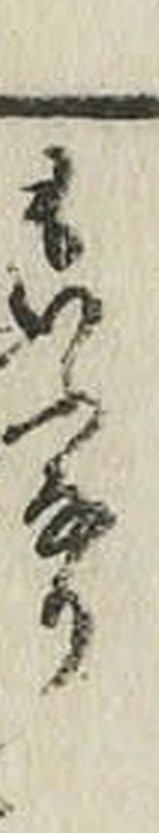もいふなり
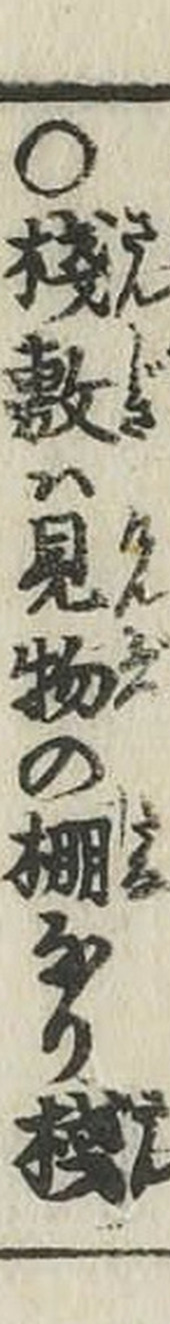○桟敷は見物の棚なり桟
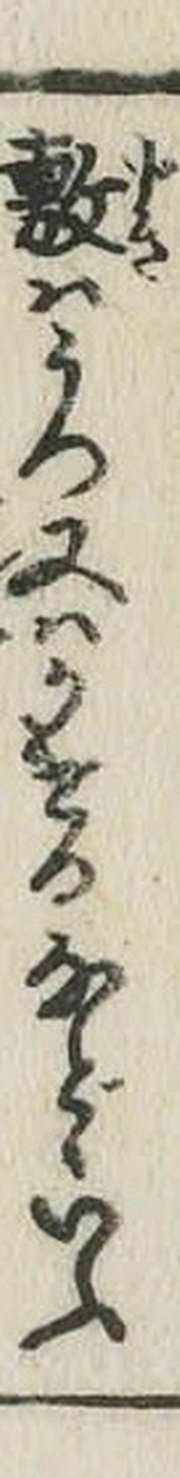敷はうつ又はかけるなどゝいふ
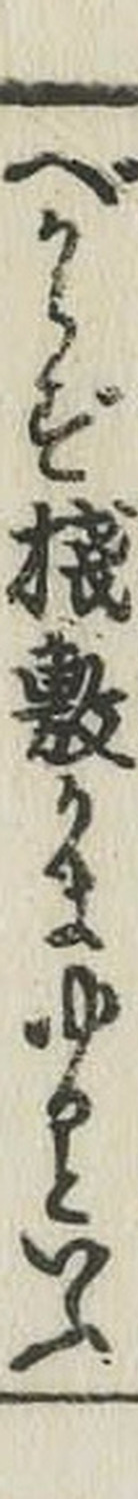べからず桟敷かまゆるといふ
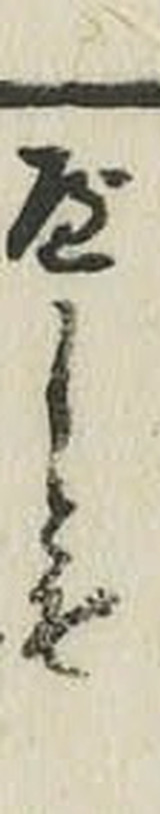べしとぞ
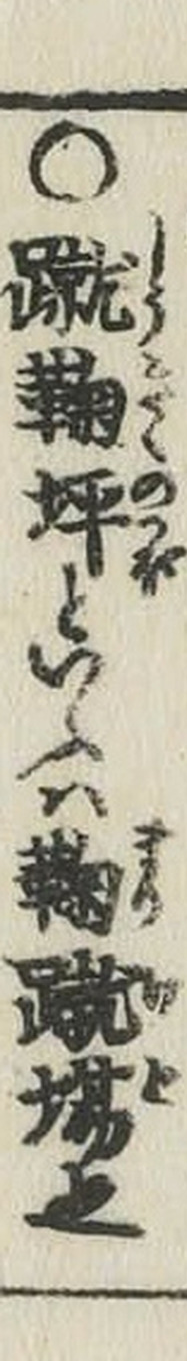○蹴鞠坪といふは鞠蹴場也
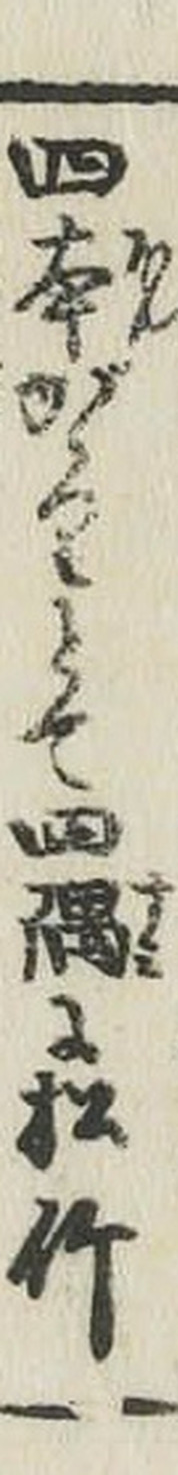四本がゝりとて四隅に松竹
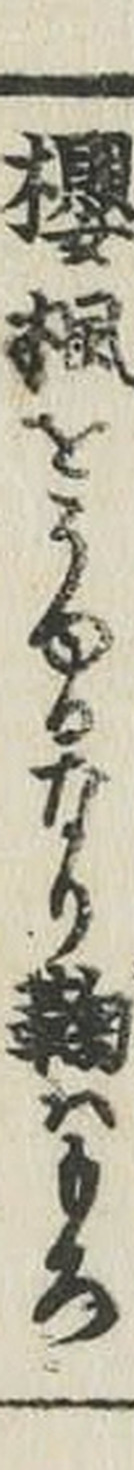桜楓をうゆるなり鞠はもろ
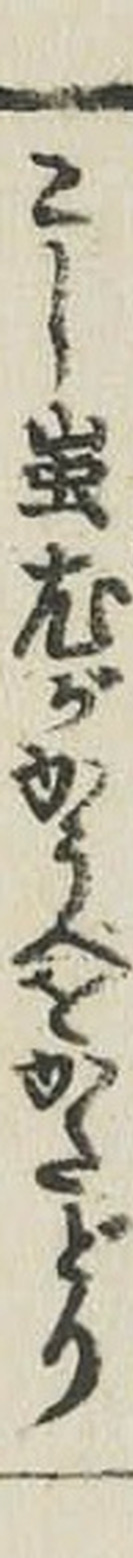こし蚩尤がかうべをかたどり
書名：増補頭書訓蒙図彙大成 10巻 2:巻之1-3
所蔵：東京学芸大学教育コンテンツアーカイブ
